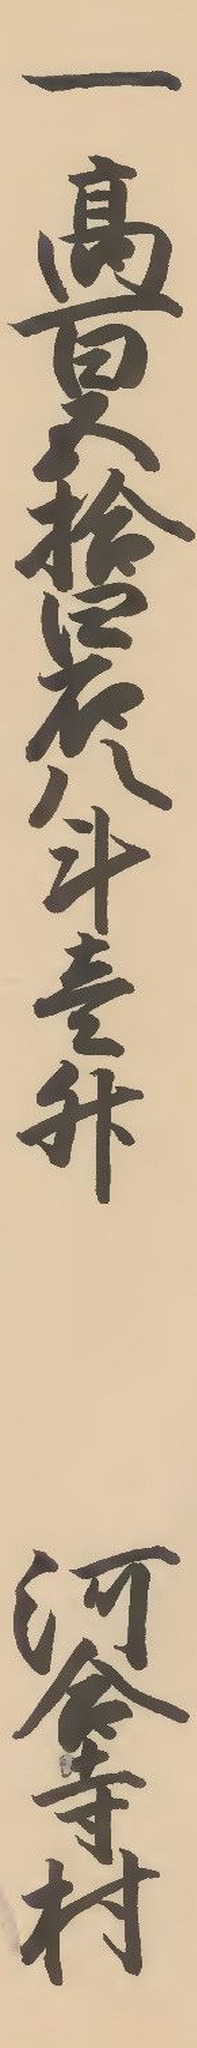一高百五拾四石八斗壱升河合寺村
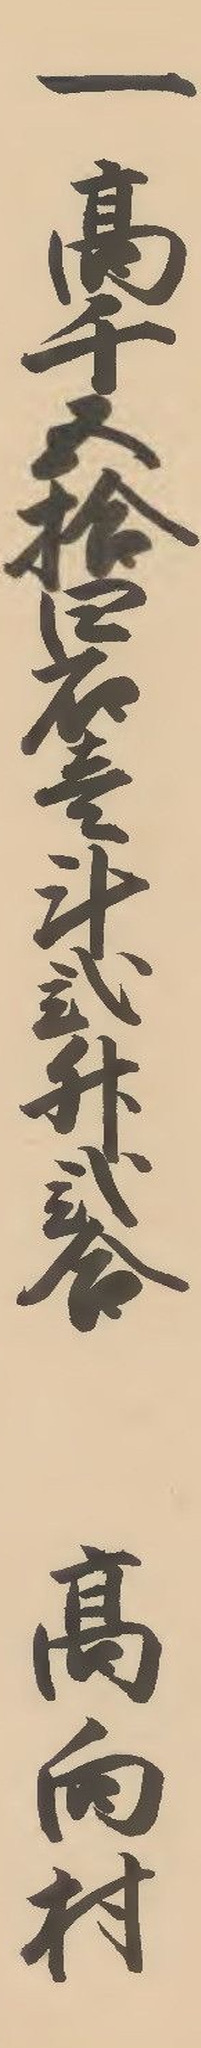一高千五拾四石壱斗弐升弐合高向村
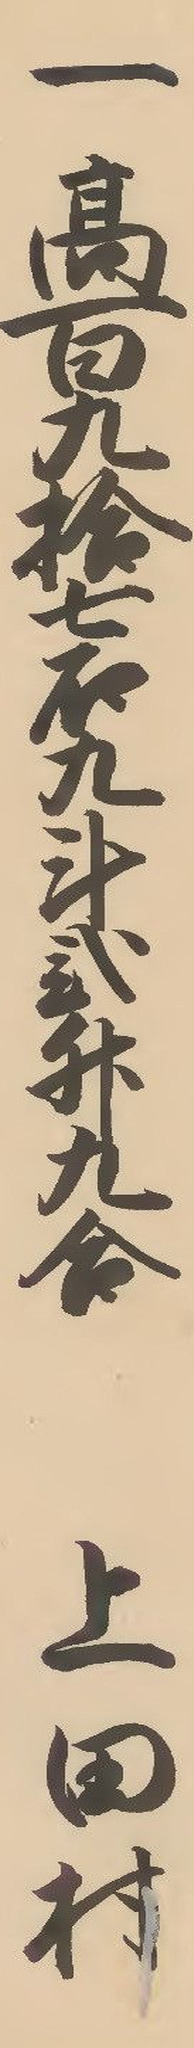一高百九拾七石九斗弐升九合上田村
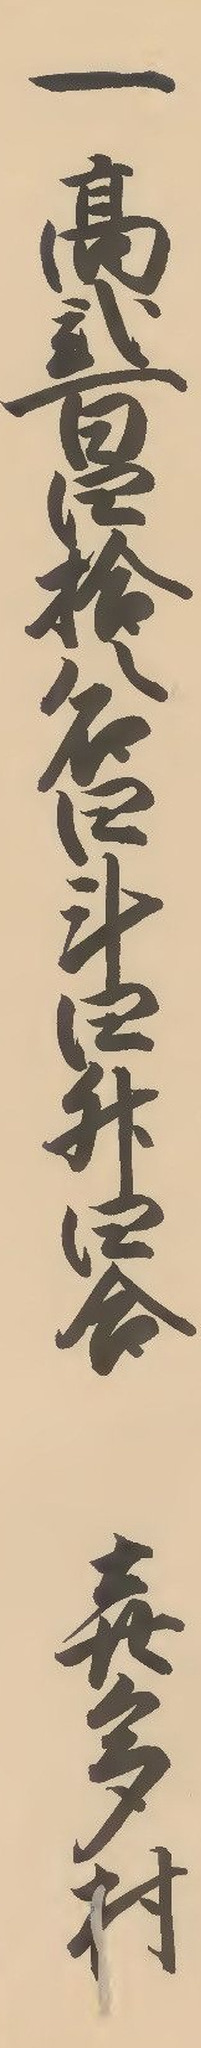一高弐百四拾八石四斗四升四合喜多村
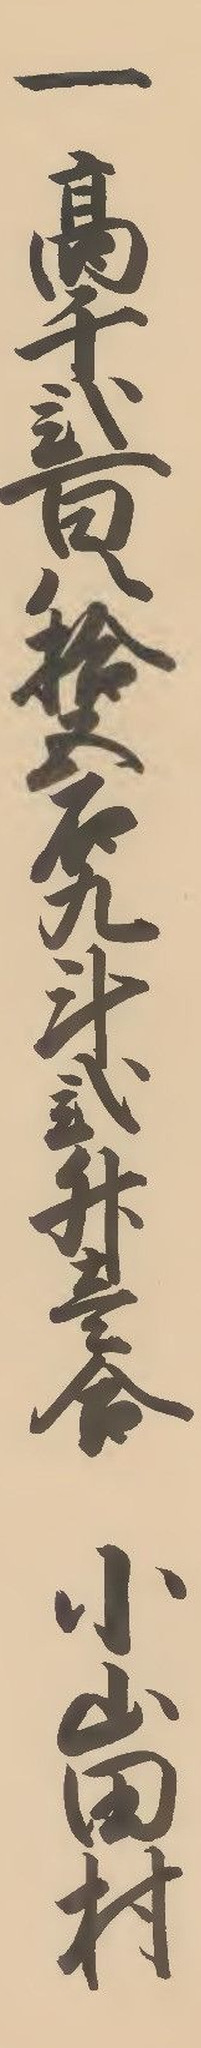一高千弐百八拾五石九斗弐升壱合小山田村
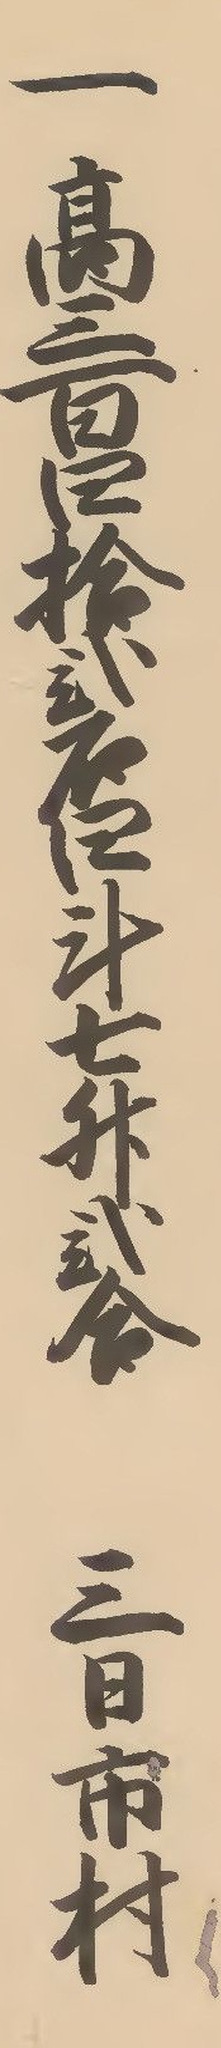一高三百四拾弐石四斗七升弐合三日市村
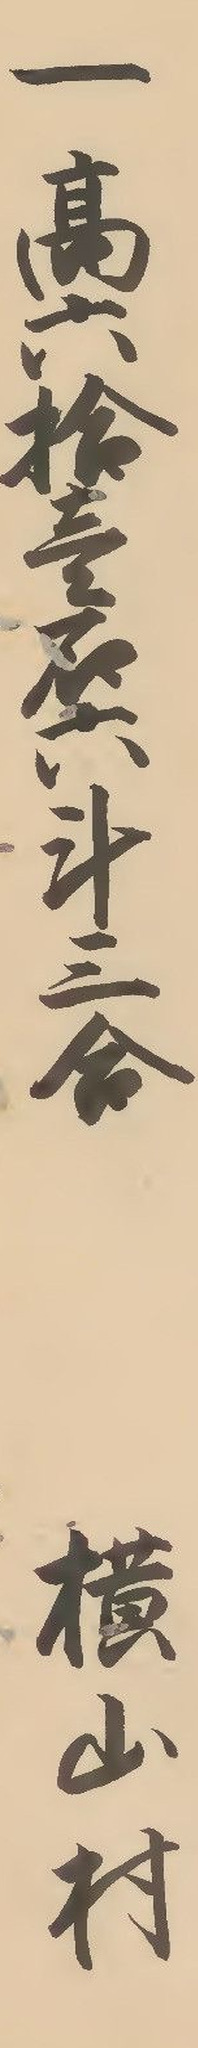一高六拾壱石六斗三合横山村

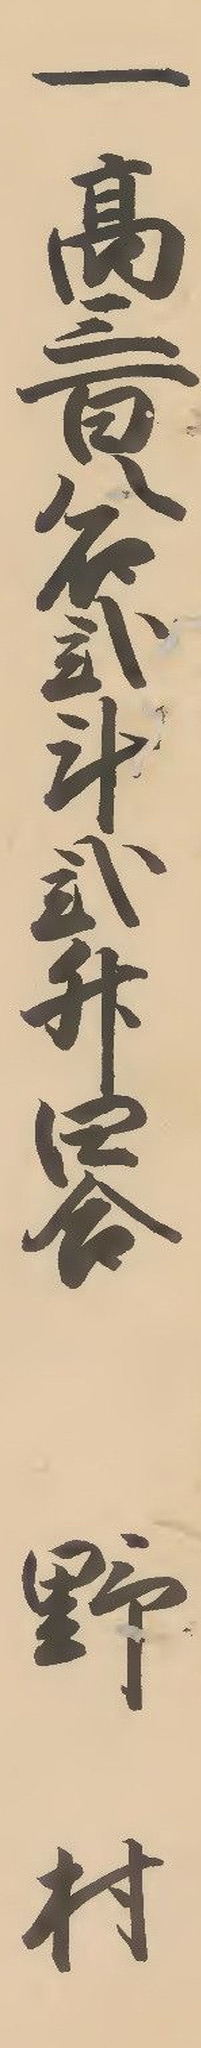一高三百八石弐斗弐升四合野村
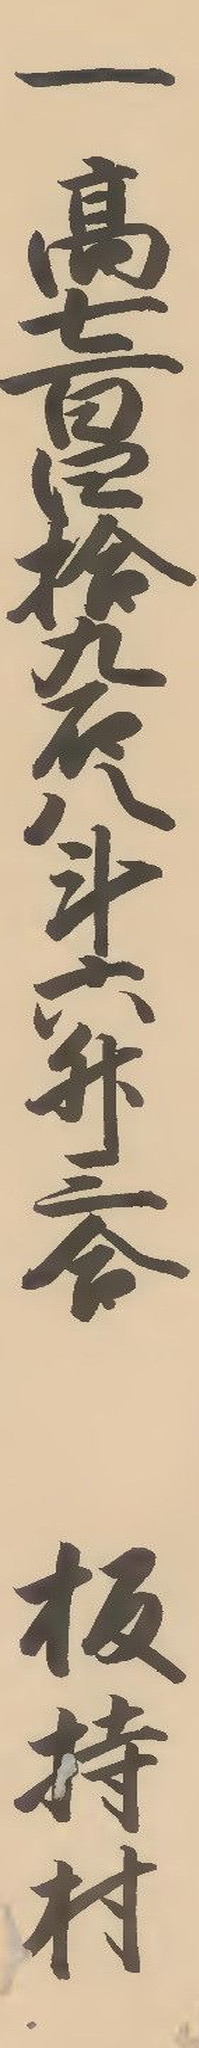一高七百四拾九石八斗六升三合板持村
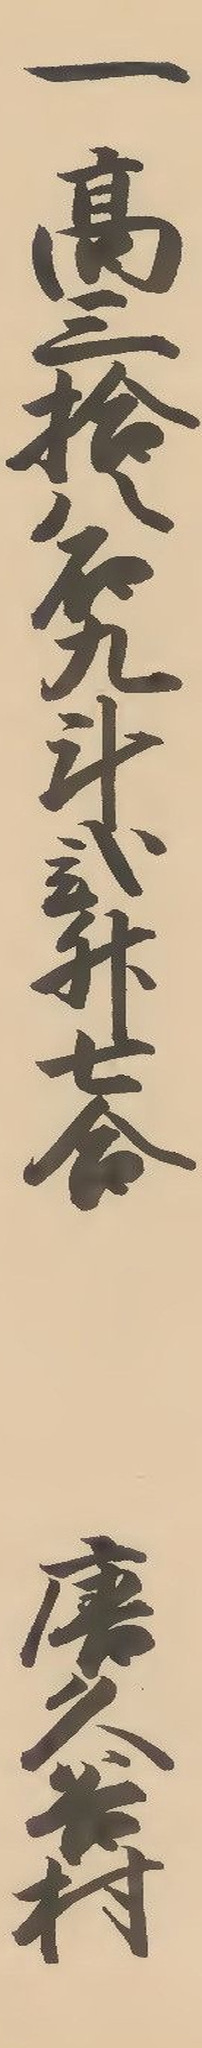一高三拾八石九斗弐升七合唐久谷村
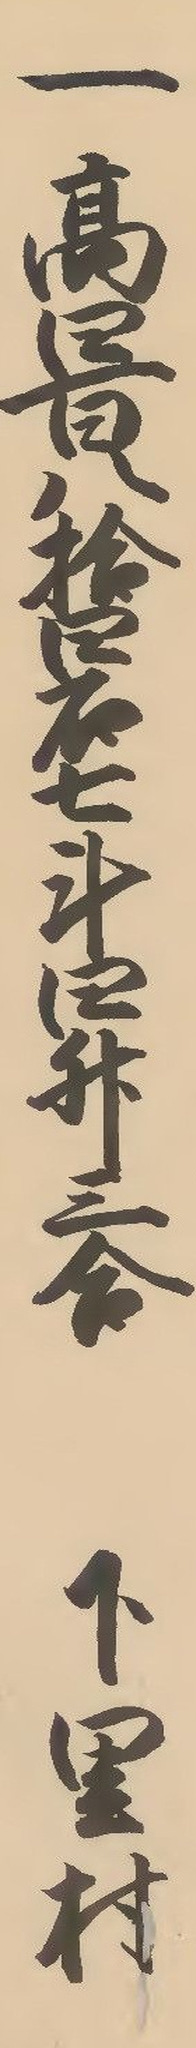一高四百八拾四石七斗四升三合下里村
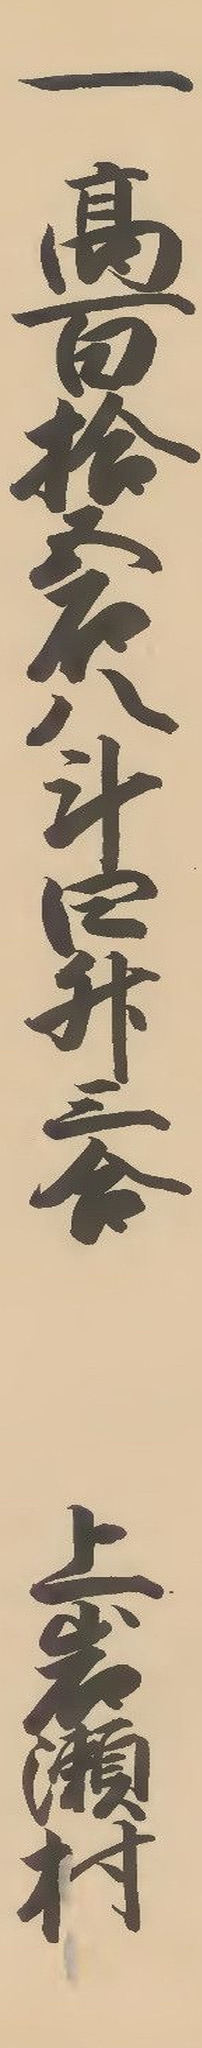一高百拾五石八斗四升三合上岩瀬村
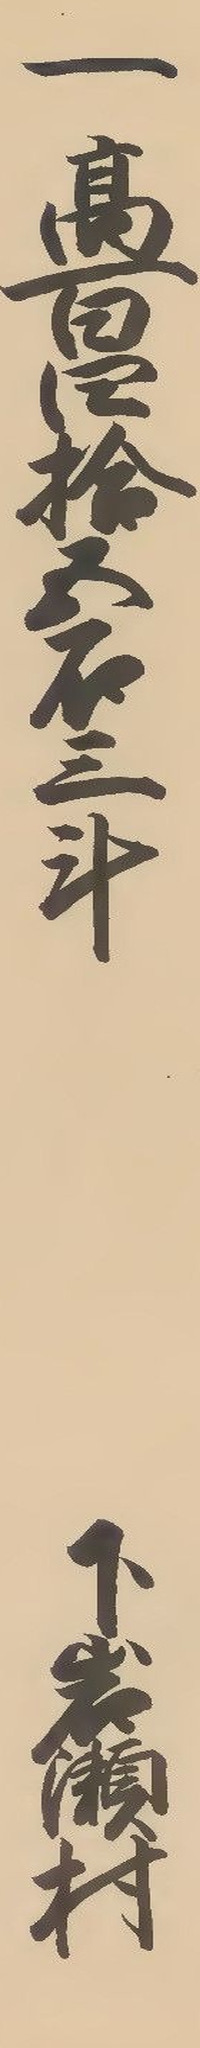一高百四拾五石三斗下岩瀬村
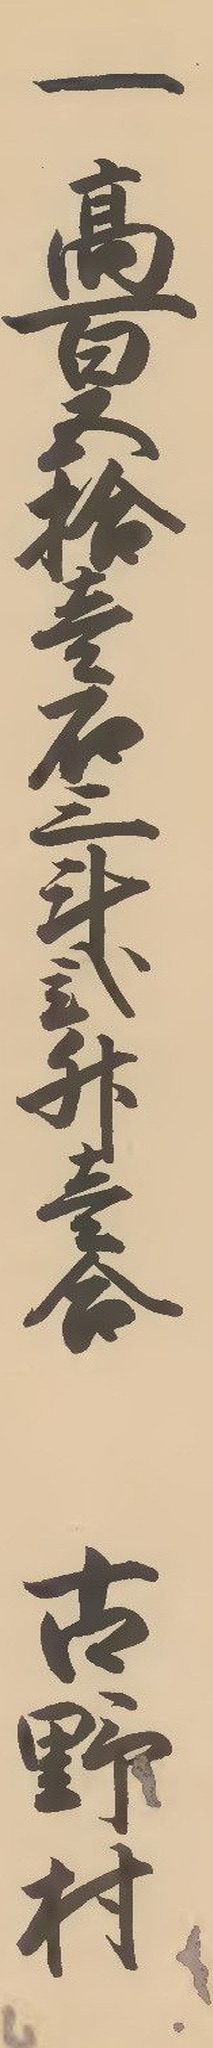一高百五拾壱石三斗弐升壱合古野村
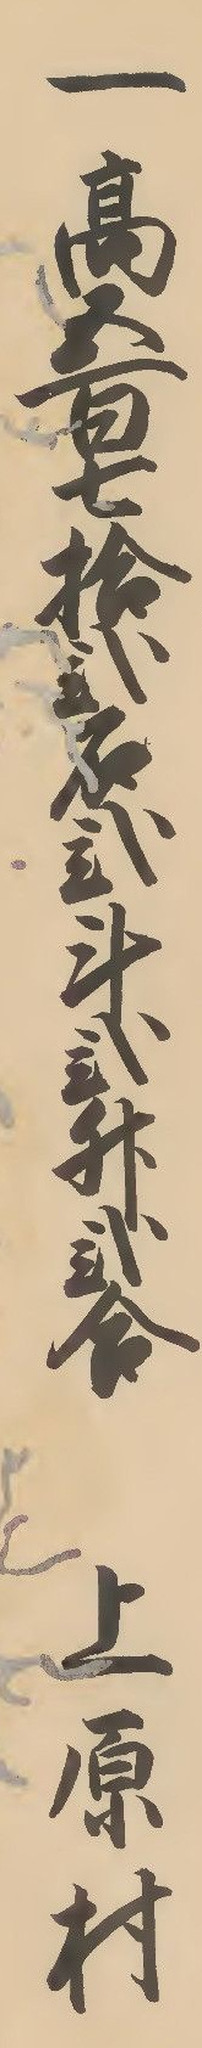一高五百七拾弐石弐斗弐升弐合上原村

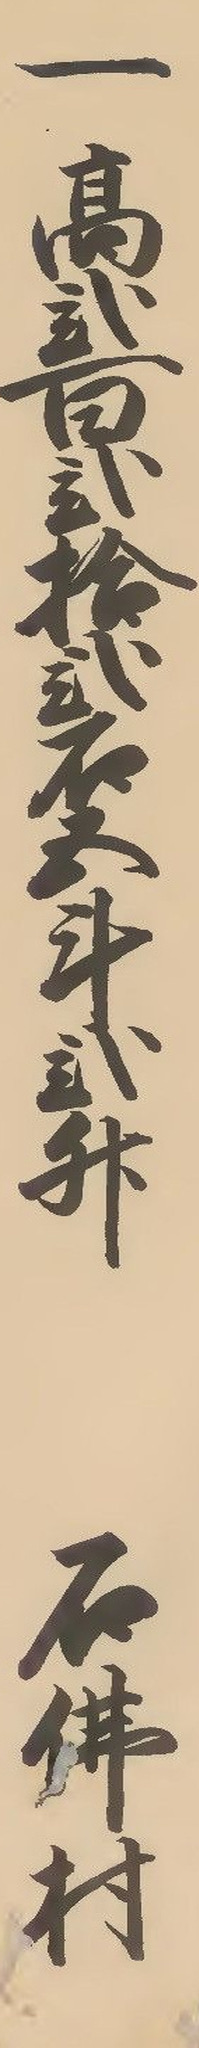一高弐百弐拾弐石五斗弐升石仏村
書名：河内国郷帳
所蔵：国立公文書館 National Archives of Japan
